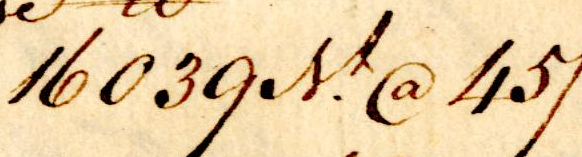16039 s^t @ 45s
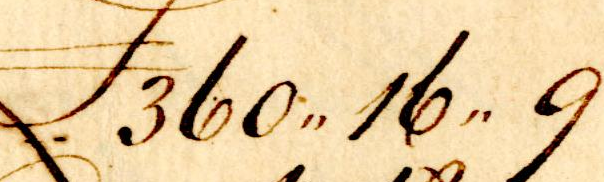£360..16..9
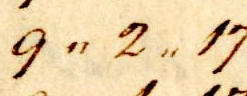9..2..17
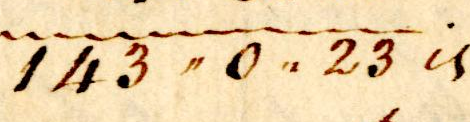143..0..23 is
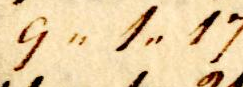9..1..17
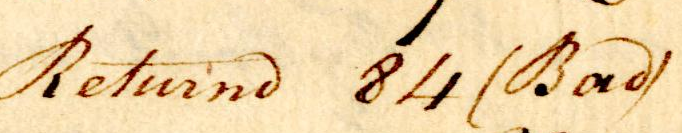Returnd 84 (Bad)
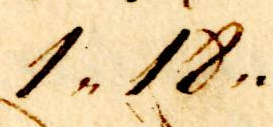1..18..
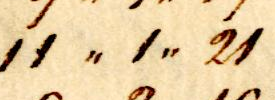11..1..21
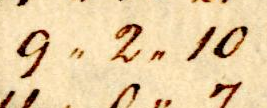9..2..10
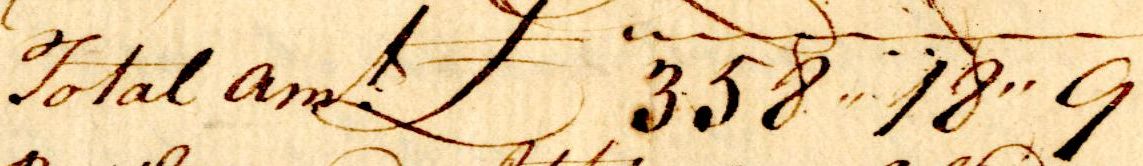Total am^t £ 358..18..9
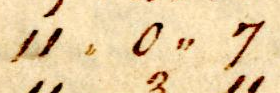11..0..7
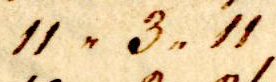11..3..11
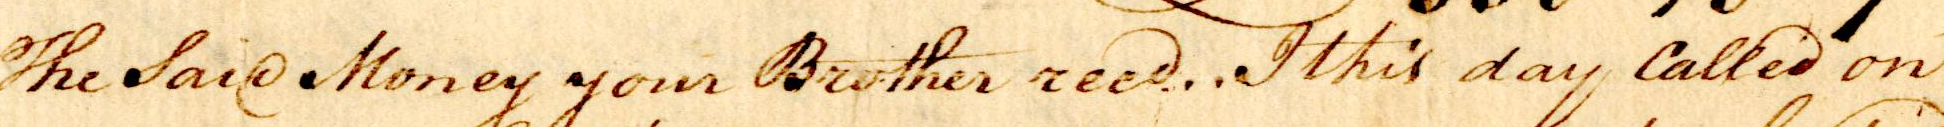the Said Money your Brother rec^d. I this day called on
